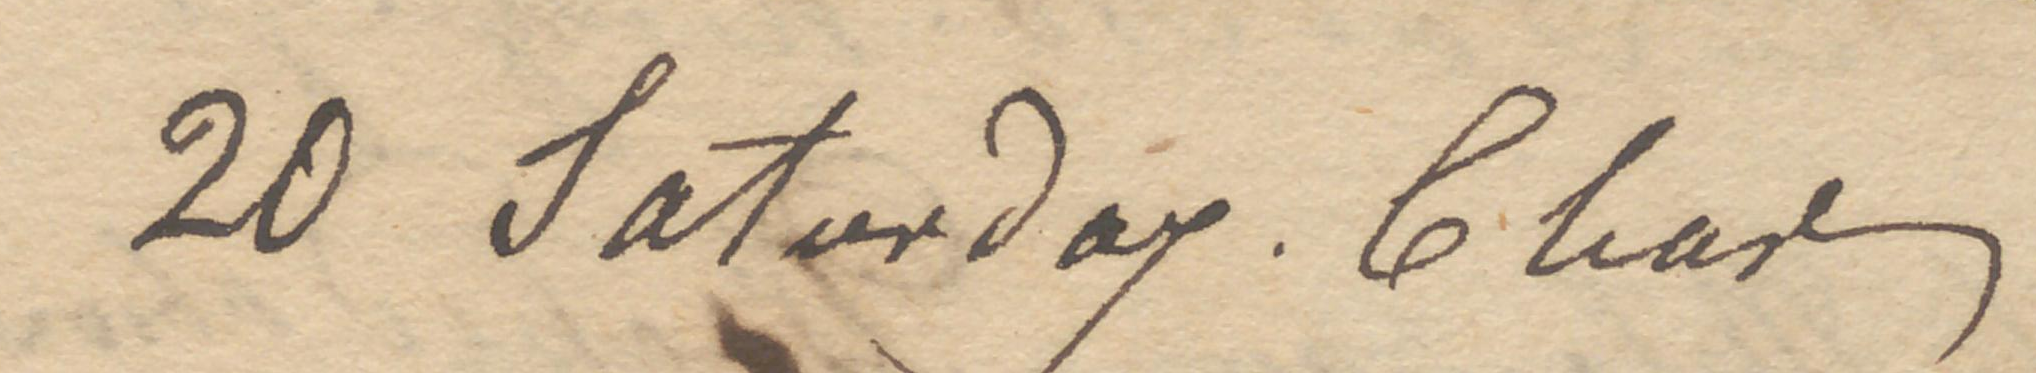20 Saturday. Clear
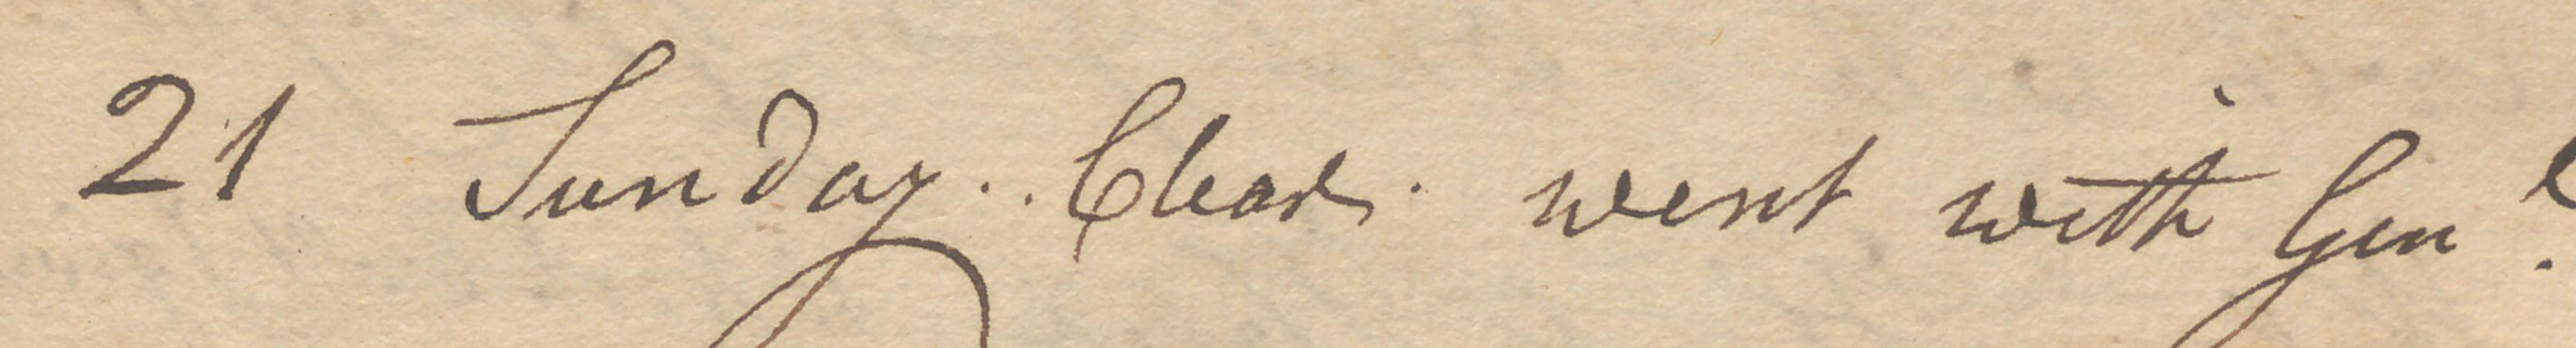21 Sunday. Clear went with Gen^l.
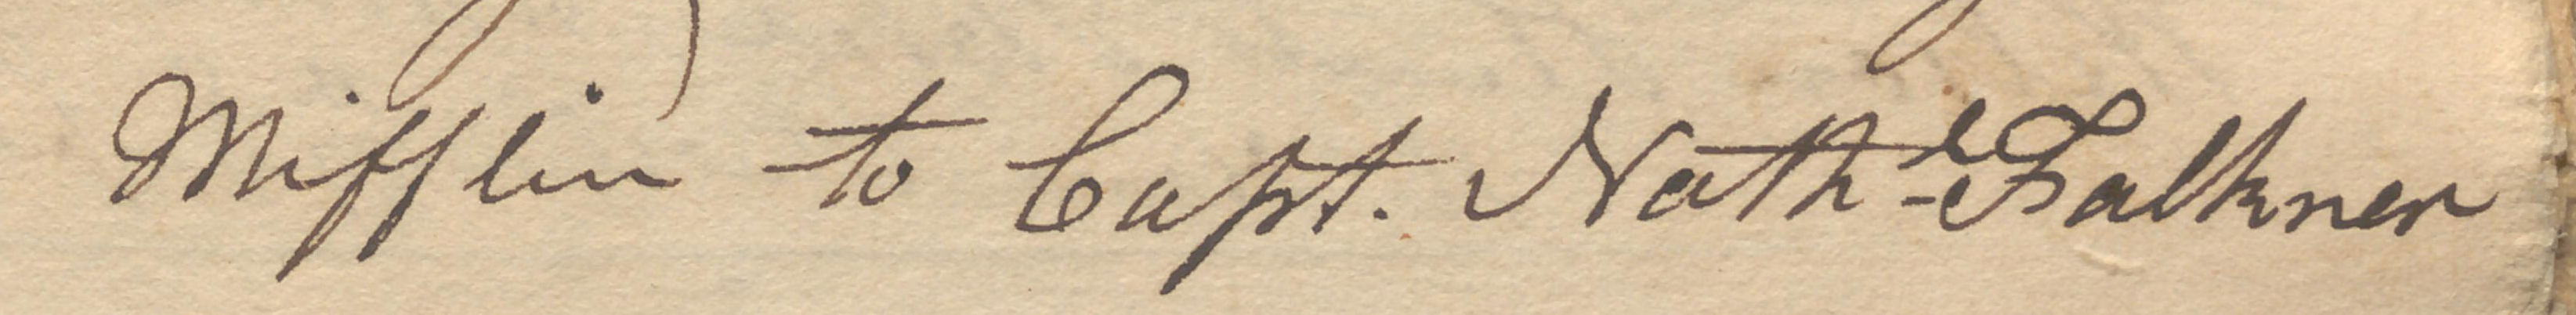Mifflin to Capt. Nath^l Falkner
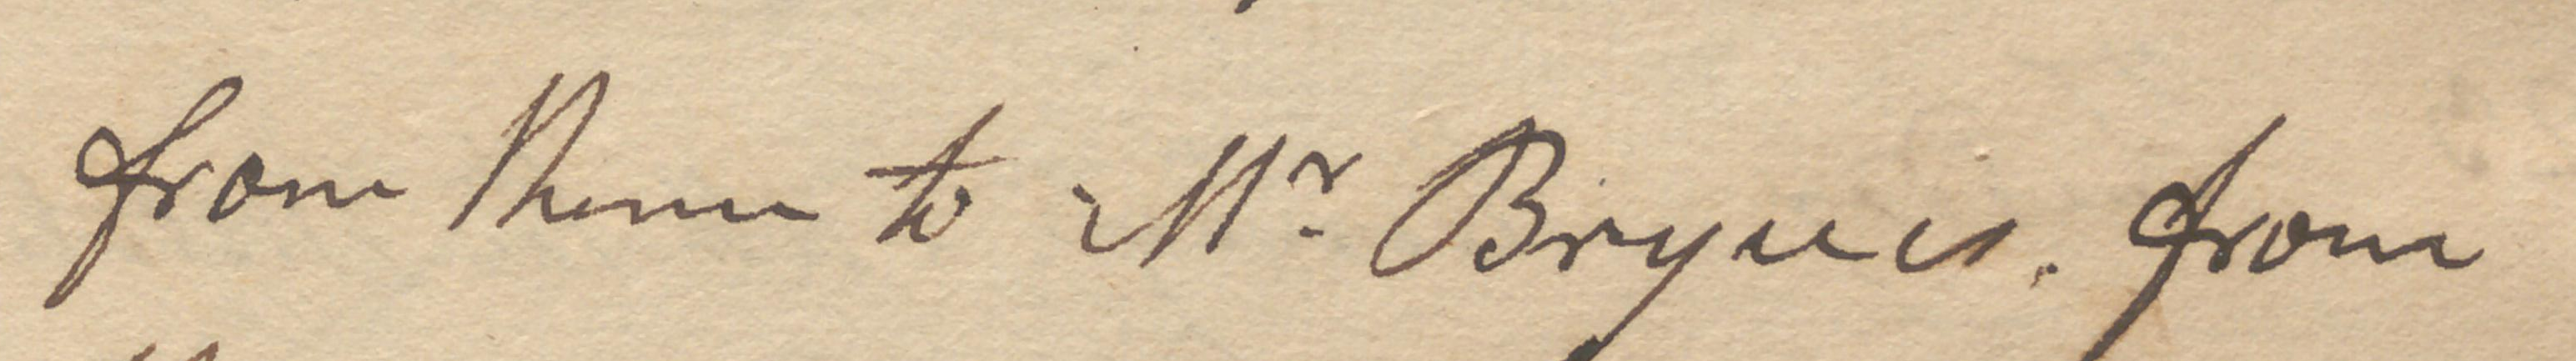from thence to M^r. Bryces. from
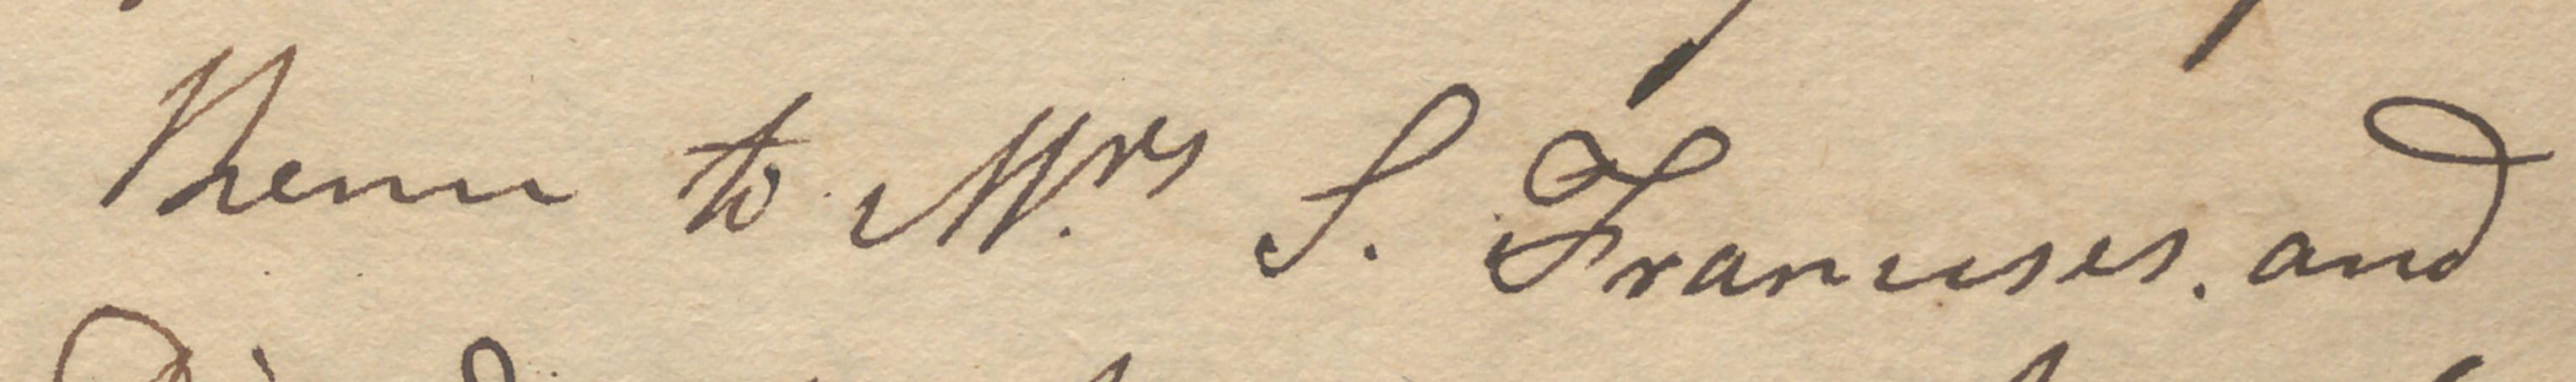thence to M^rs. S^th. Francises, and
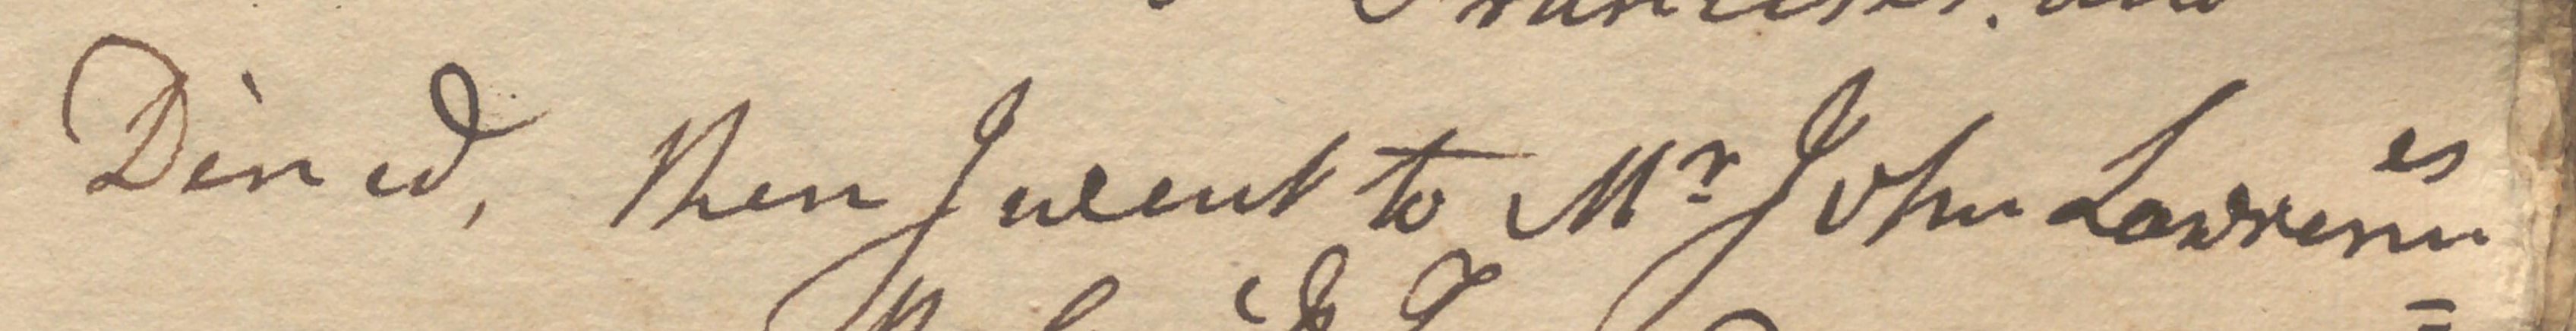Dined, then I went to M^r. John Lawrenc^es
